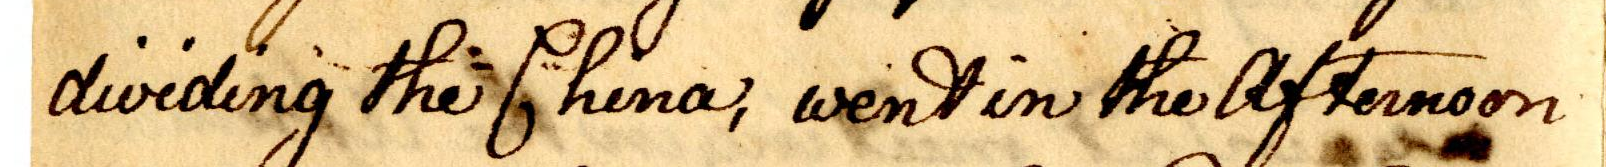dividing the China, went in the Afternoon
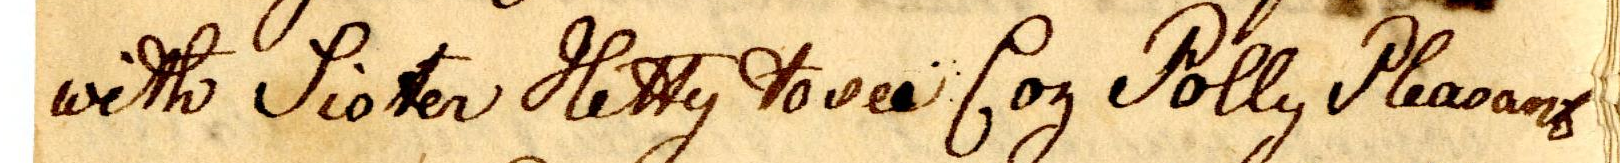with Sister Hetty to see Coz Polly Pleasants
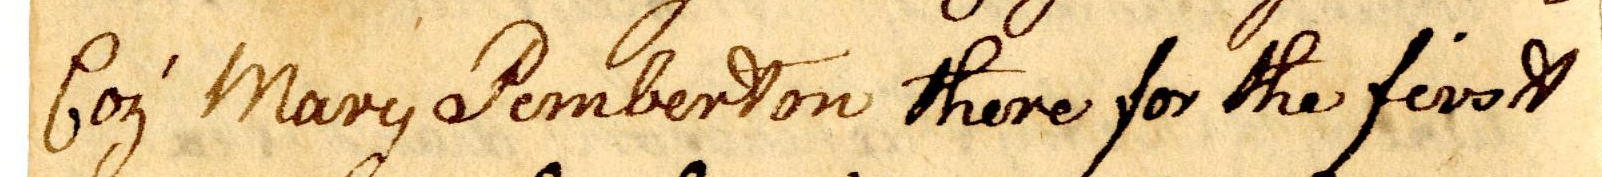Coz' Mary Pemberton there for the first
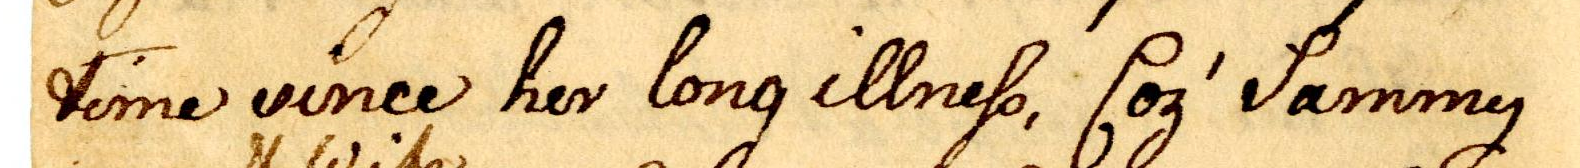time since her long illness, Coz' Sammy
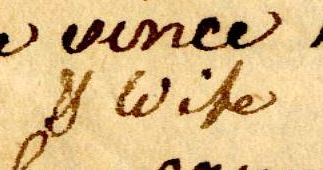& Wife
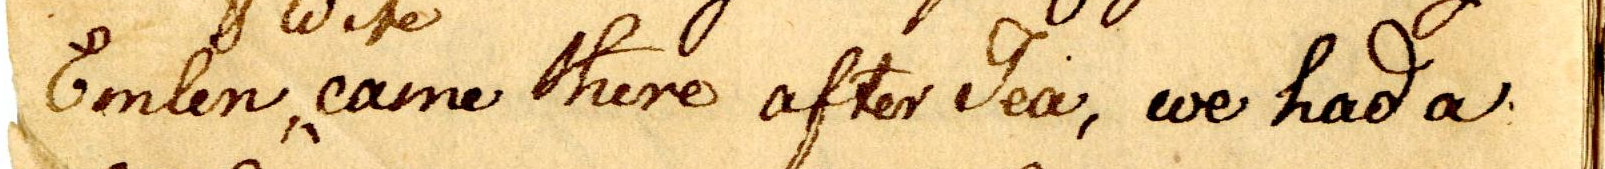Emlen ^ came there after Tea, we had a
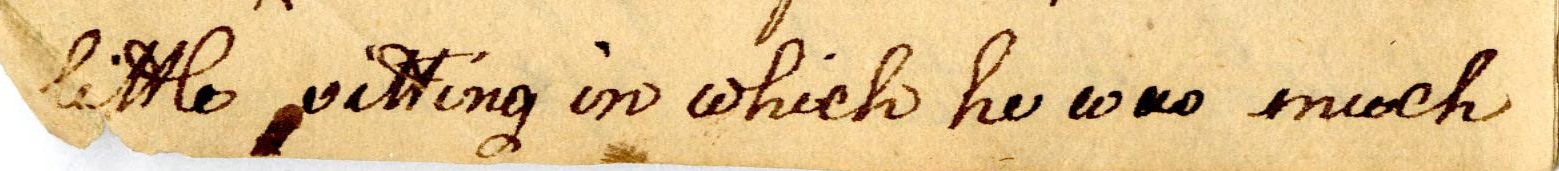little sitting in which he was much
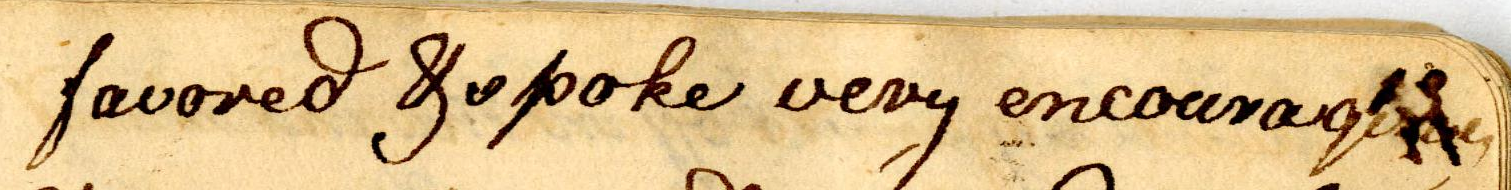favored & spoke very encouraging
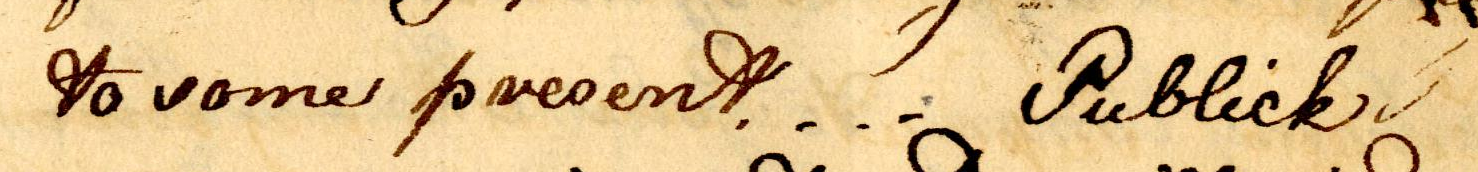to some present.... Publick
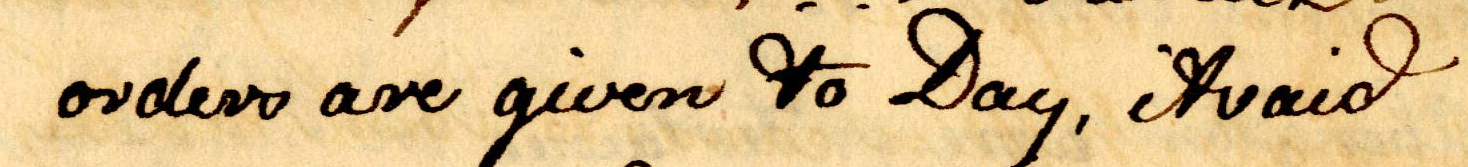orders are given to Day, it said
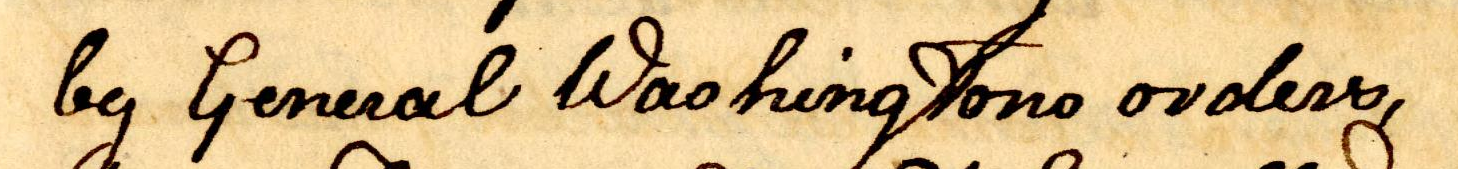by General Washingtons orders,
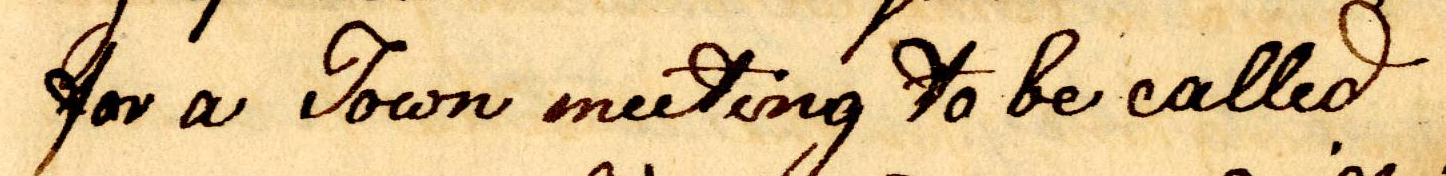for a Town meeting to be called
